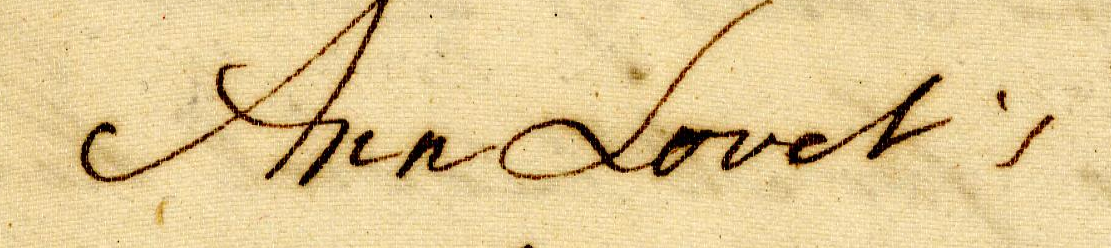Ann Lovet's
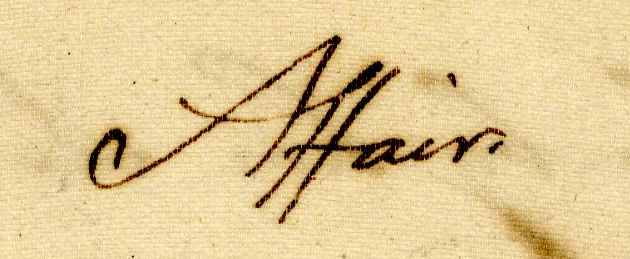Affair.
